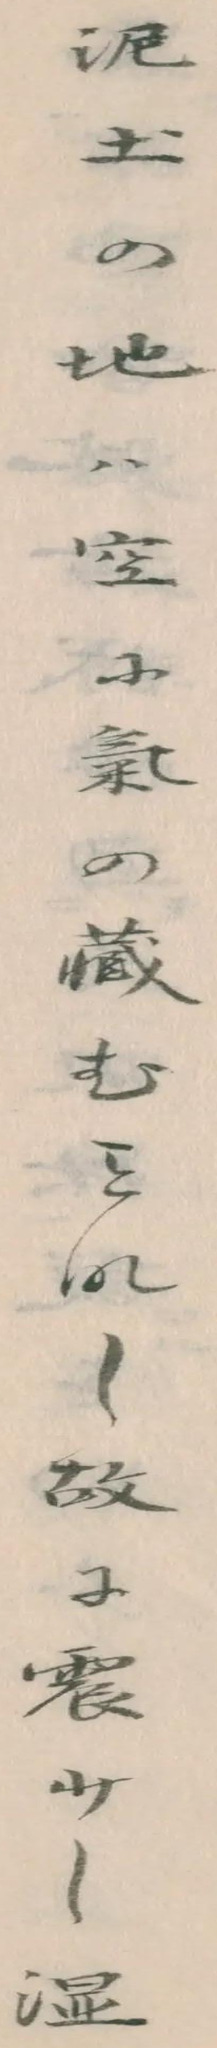泥土の地は空に気の蔵むことなし故に震少し湿
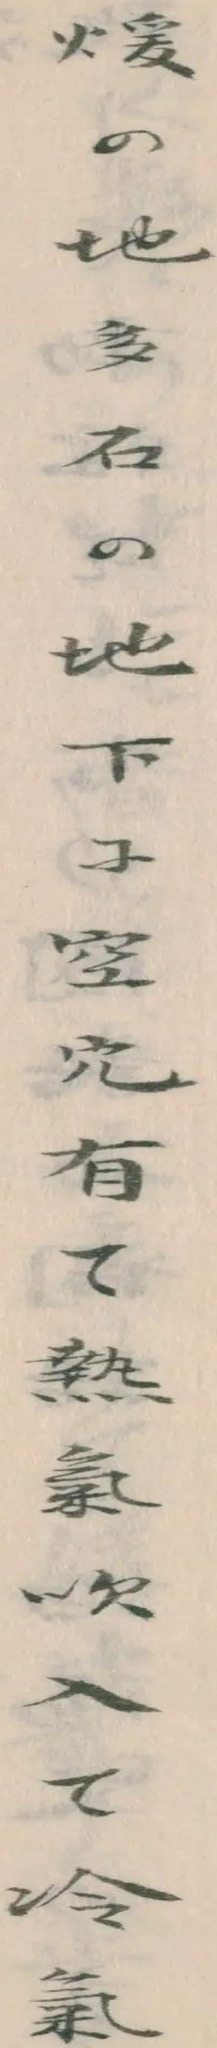煖之地多石の地下に空穴有て熱気吹入て冷気
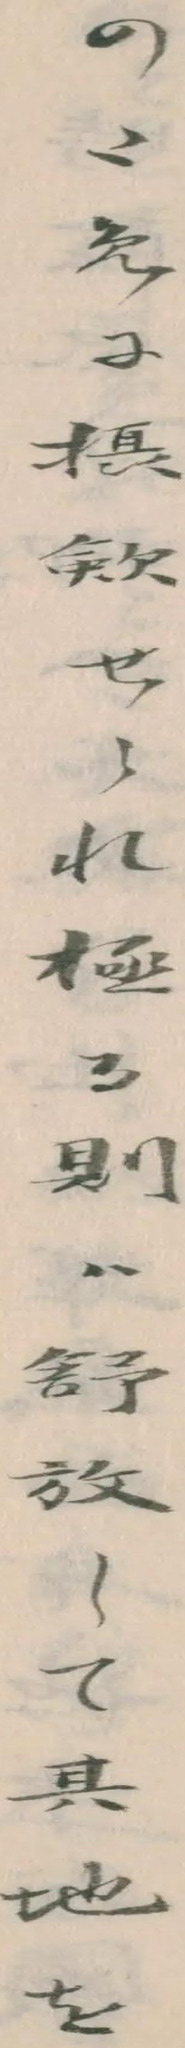のために摂斂せられ極る則は舒放して其地を
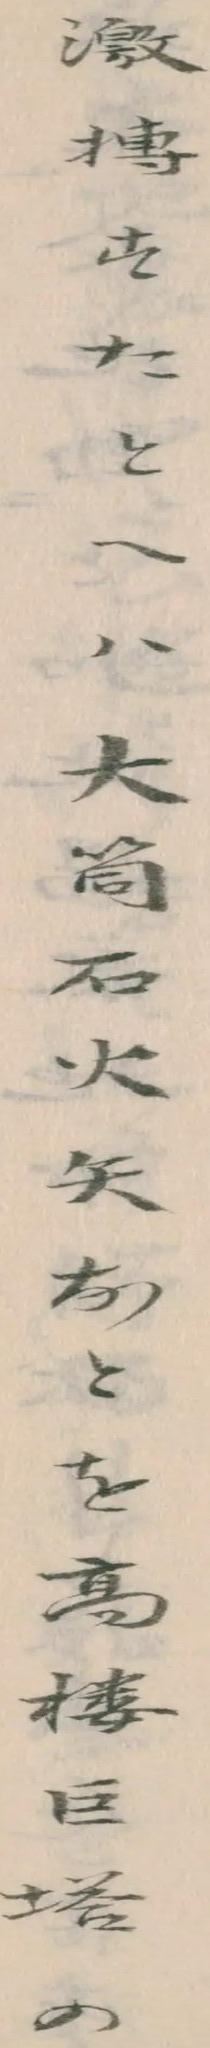激摶すたとへは大筒石火矢などを高楼巨塔の
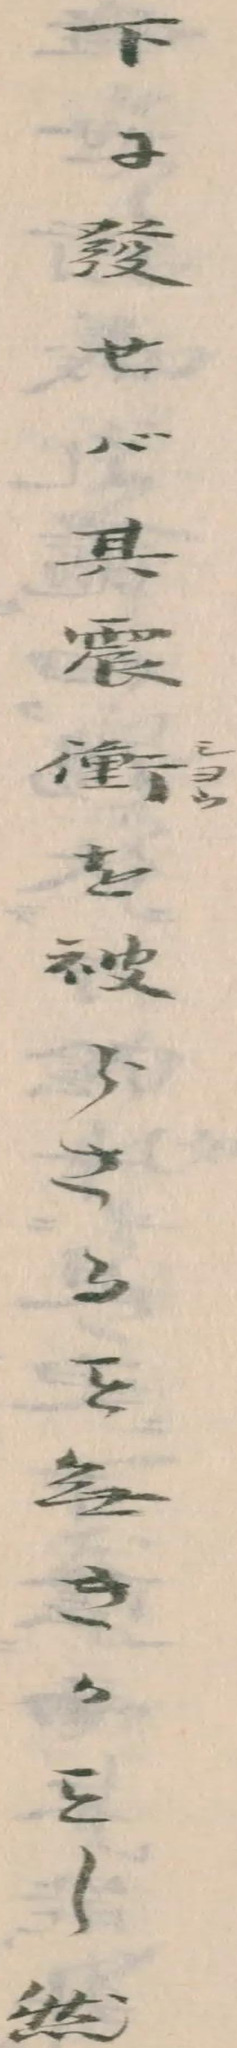下に発せば其震衝を被らさること無きかことし然
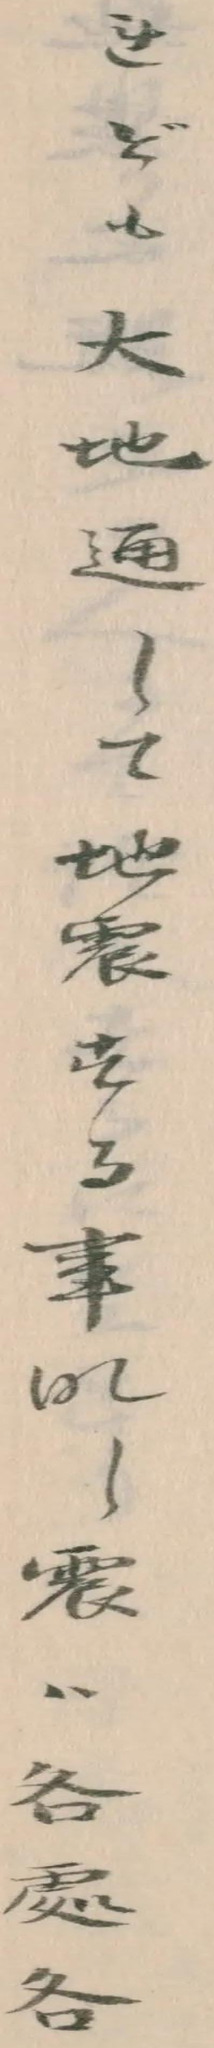れども大地通して地震する事なし震は各処各
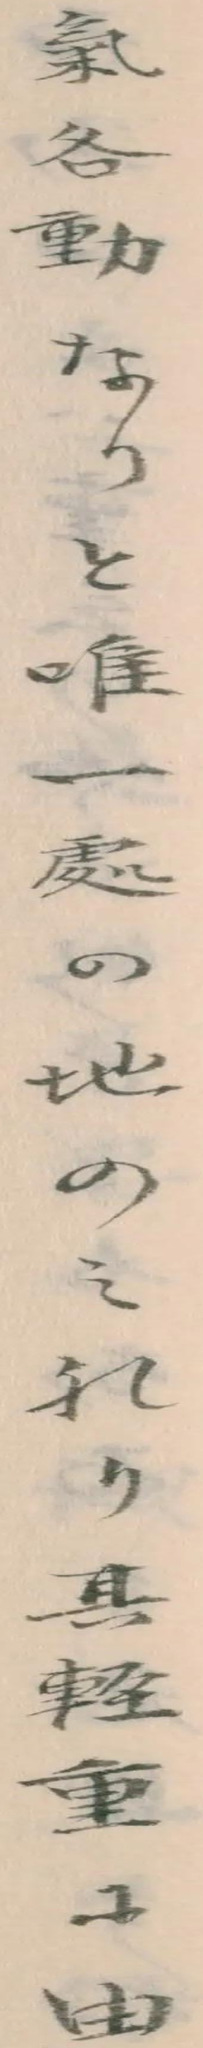気各動なりと唯一処の地のみなり其軽重に由
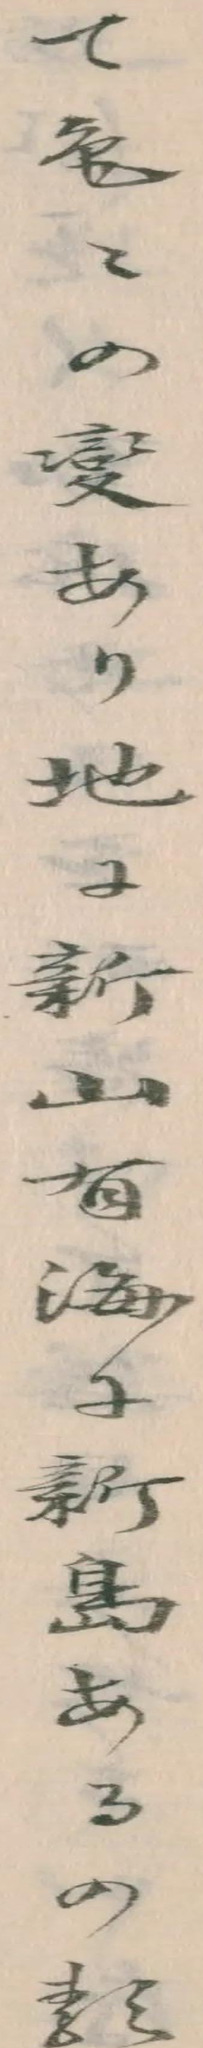て色々の変あり地に新山有海に新島あるの類
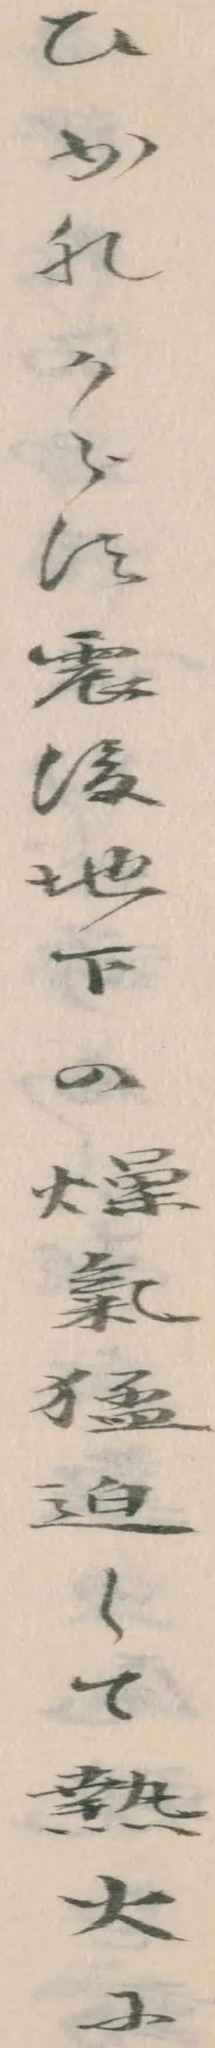ひ少なからす震後地下の燥気猛迫して熱火に
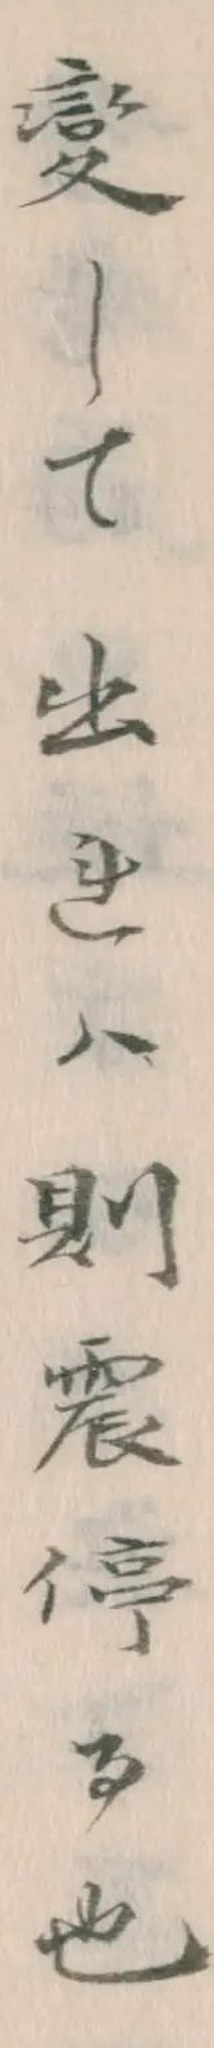変して出れは則震停る也
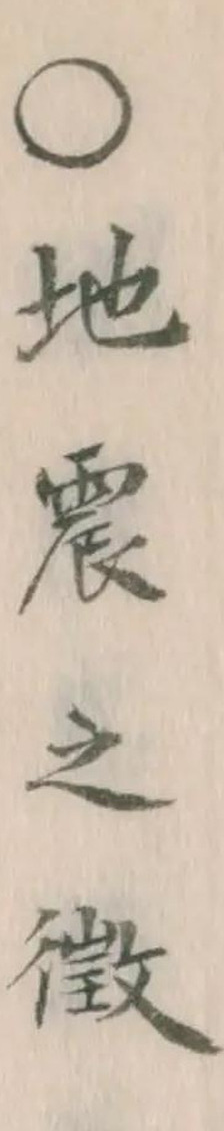○地震之徴
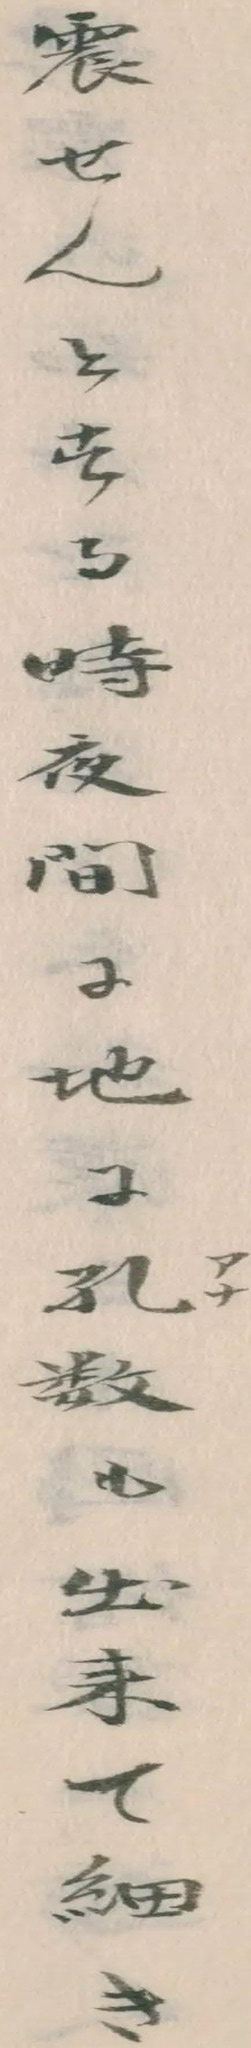震せんとする時夜間に地に孔数も出来て細き
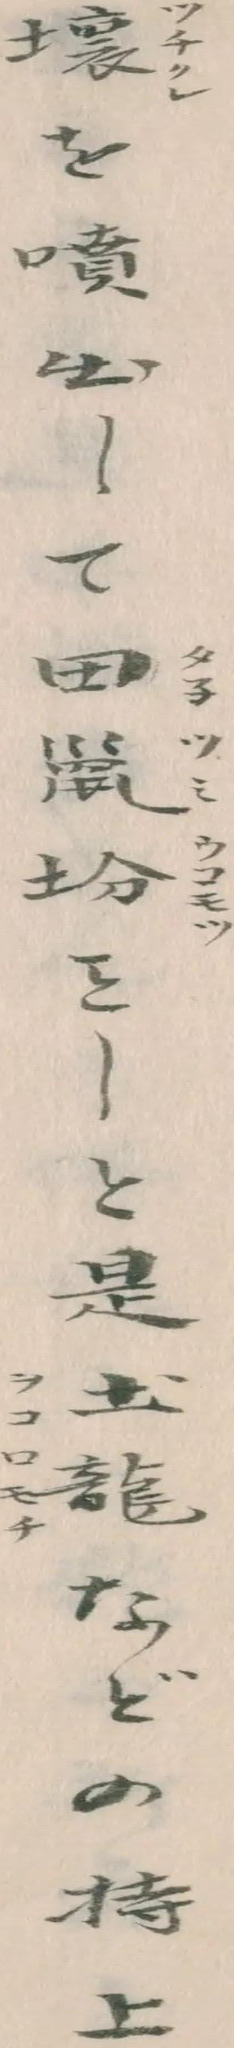壌を噴出して田鼠坌ことしと是土龍などの持上
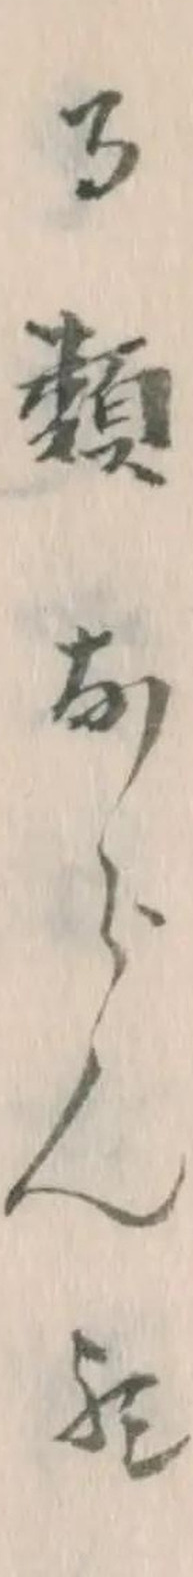る類ならん歟
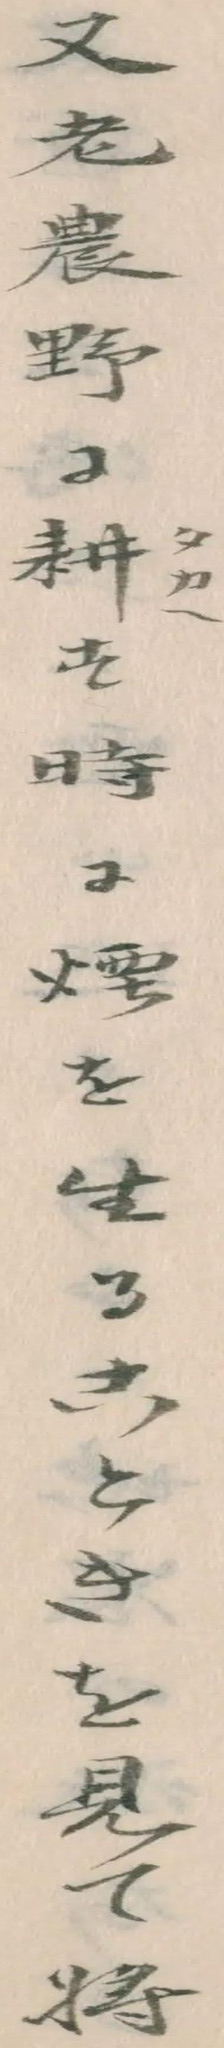又老農野に耕す時に煙を生ることきを見て将
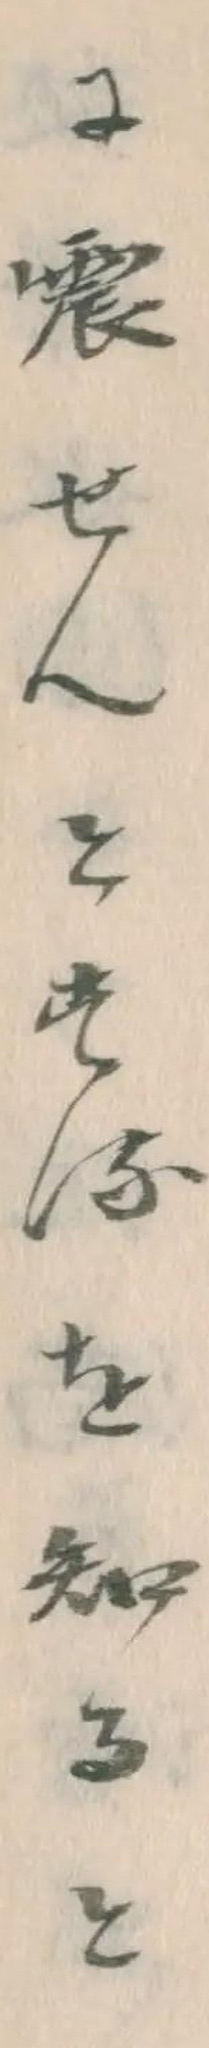に震せんとするを知ると
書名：地災撮要. 巻11-12(地震之部)
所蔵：国立国会図書館 National Diet Library, JAPAN
